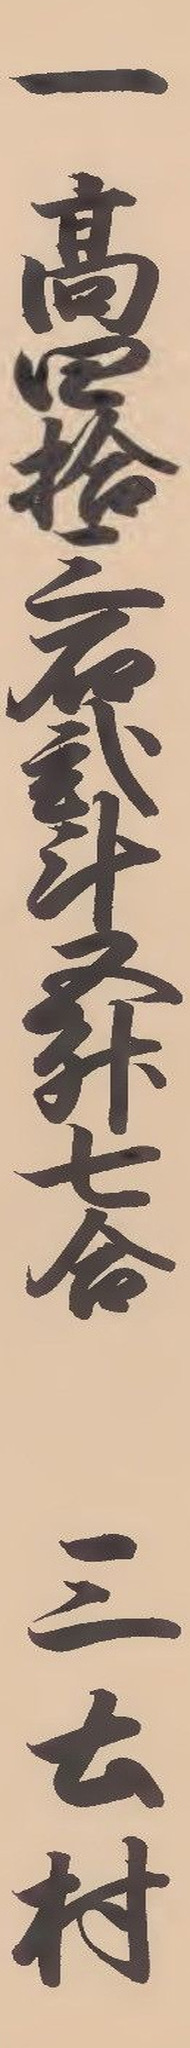一高四拾三石弐斗五升七合三土村
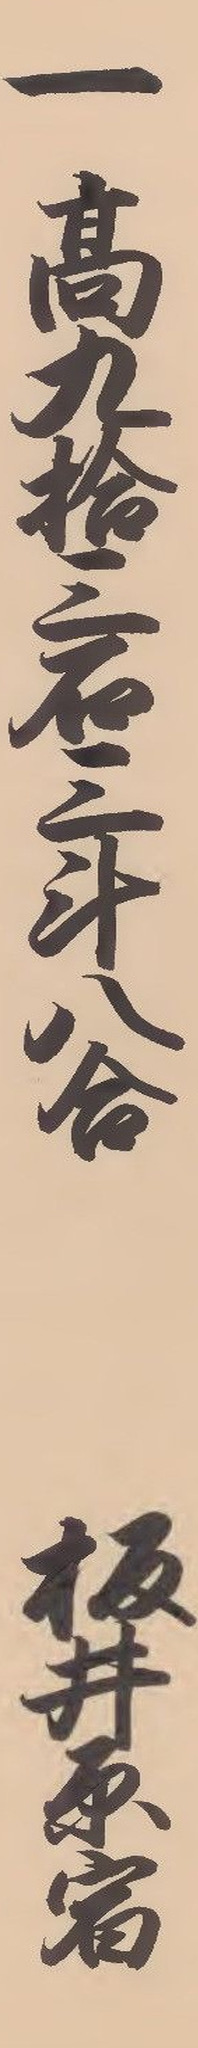一高九拾三石三斗八合板井原宿
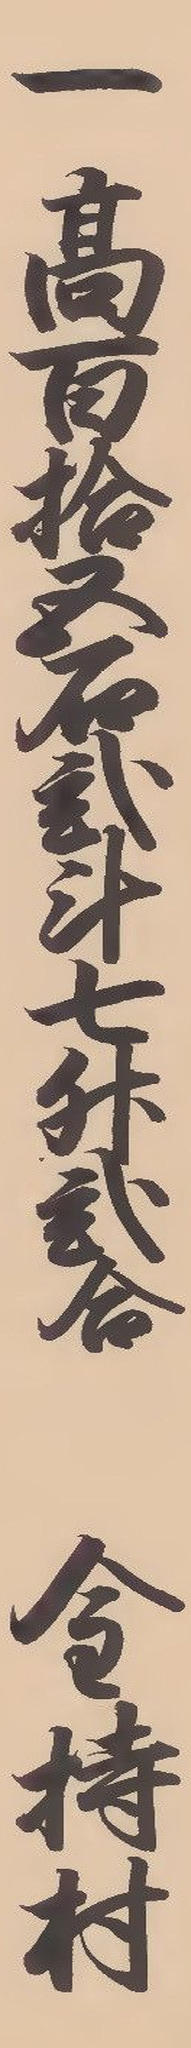一高百拾五石弐斗七升弐合金持村

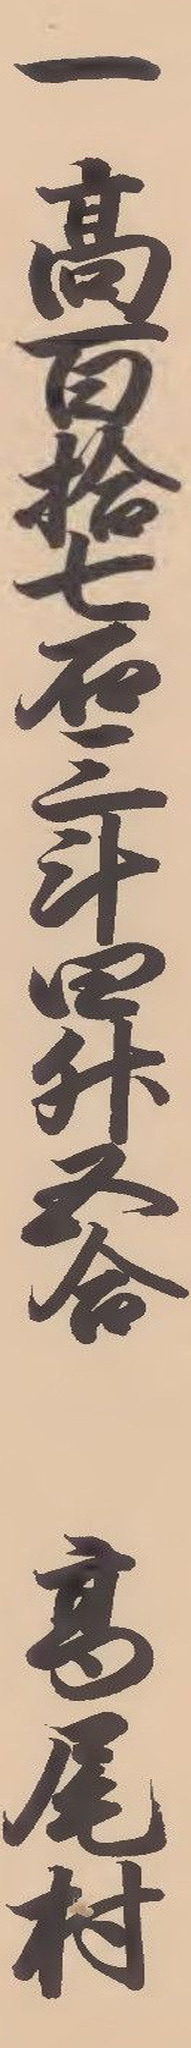一高百拾七石三斗四升五合高尾村
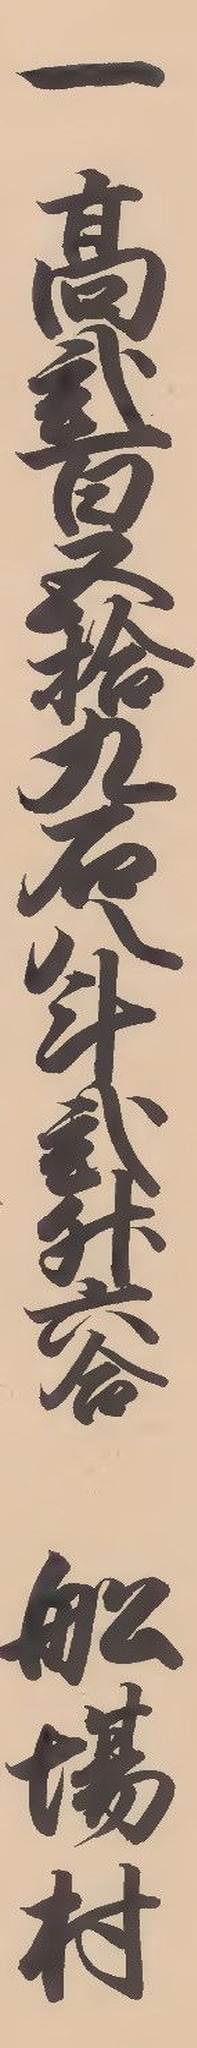一高弐百五拾九石八斗弐升六合船場村
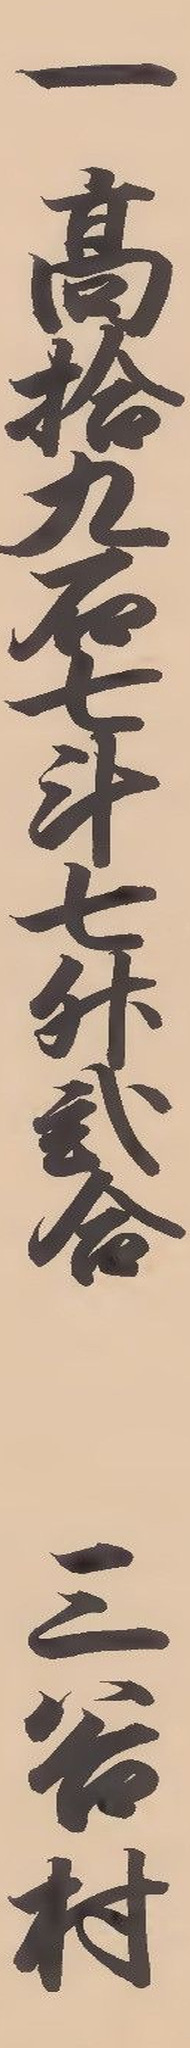一高拾九石七斗七升弐合三谷村
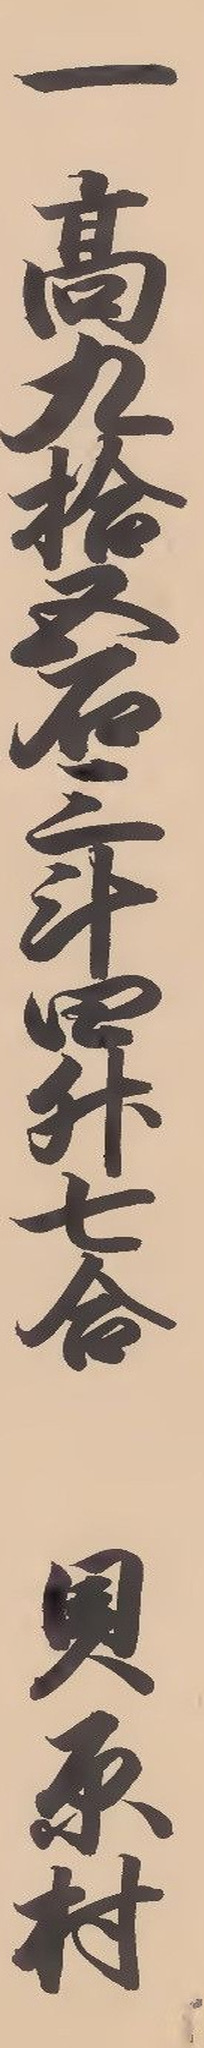一高九拾五石三斗四升七合貝原村
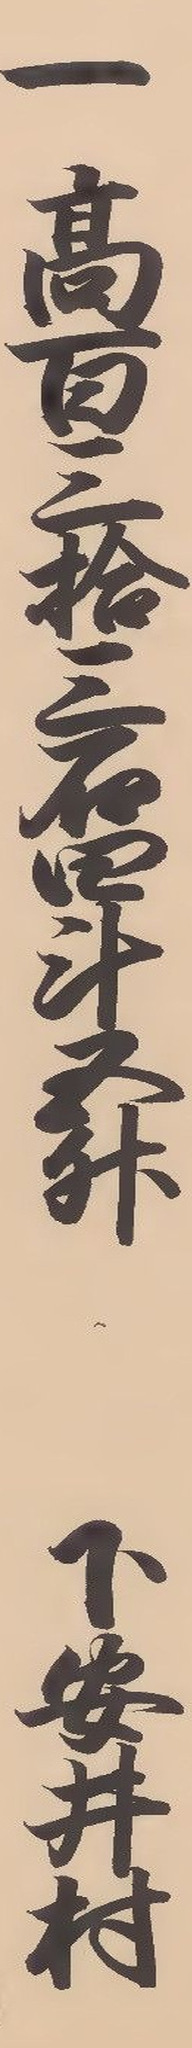一高百三拾三石四斗五升下安井村
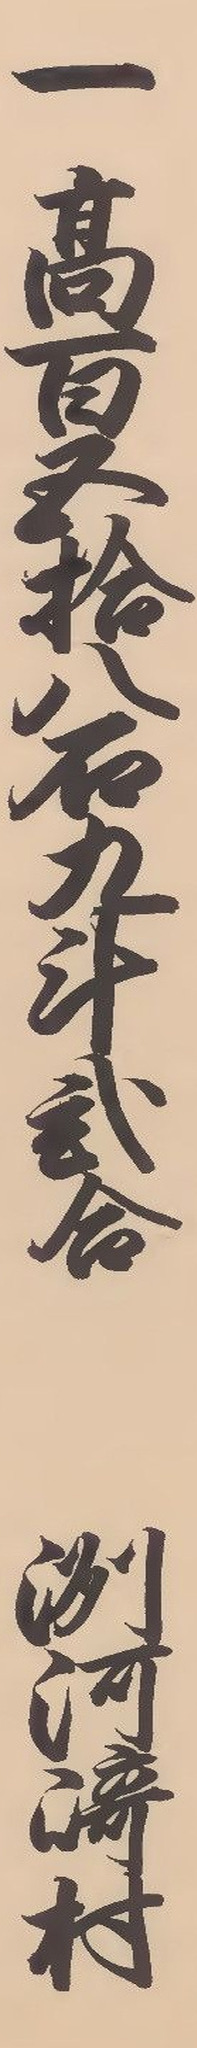一高百五拾八石九斗弐合洲河崎村
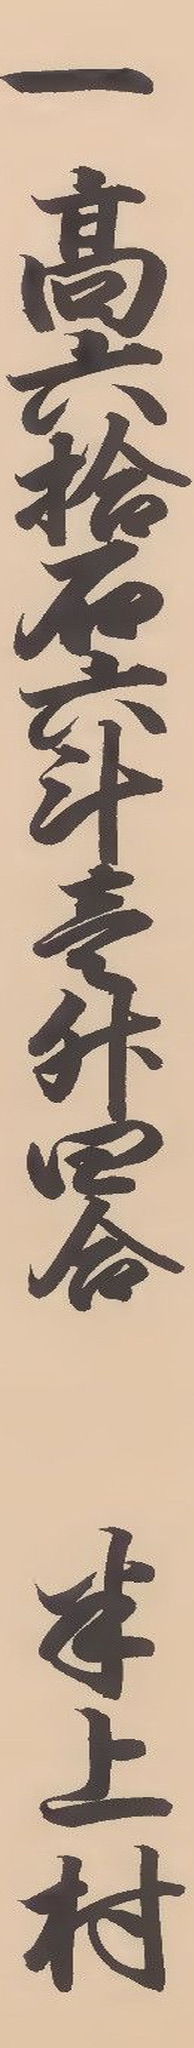一高六拾石六斗壱升四合半上村
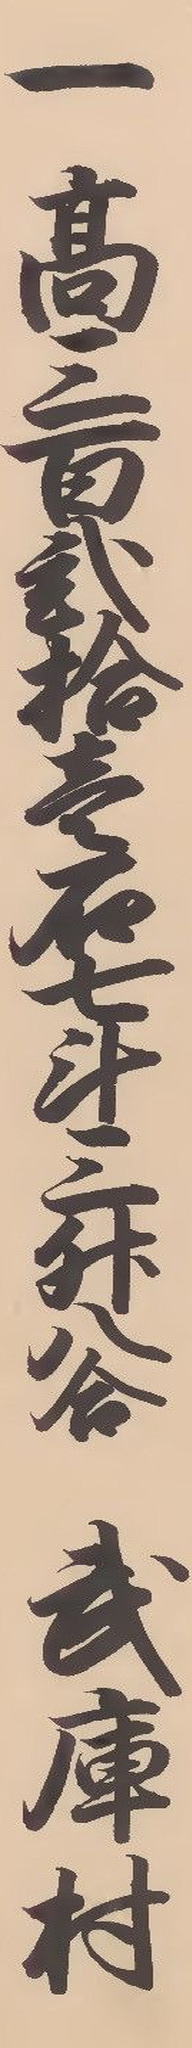一高三百弐拾壱石七斗三升八合武庫村

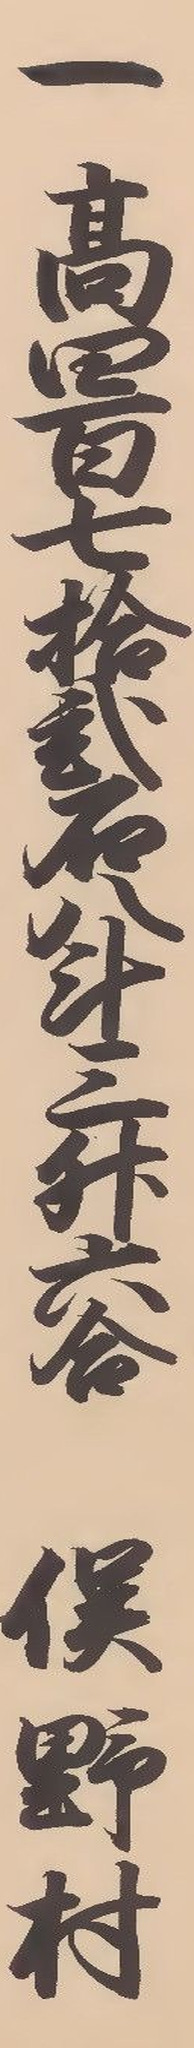一高四百七拾弐石八斗三升六合俣野村
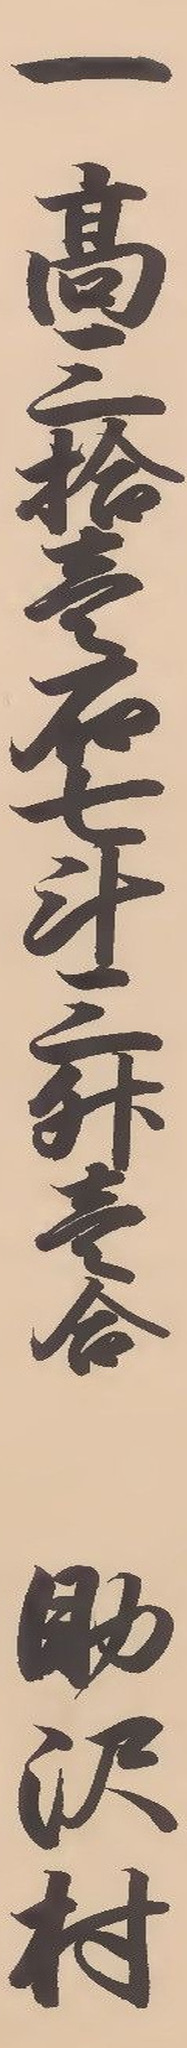一高三拾壱石七斗三升壱合助沢村
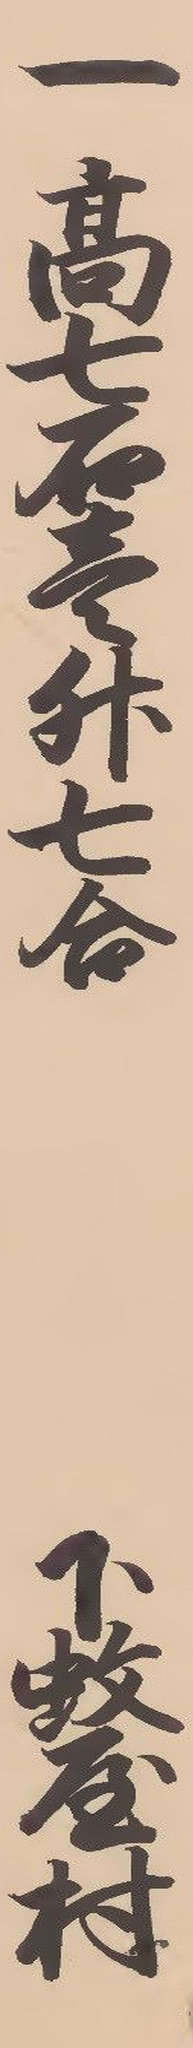一高七石壱升七合下蚊屋村
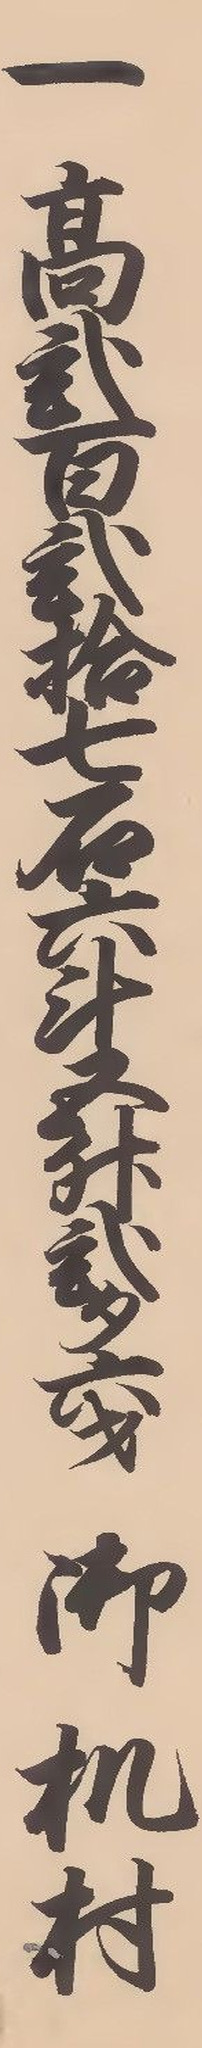一高弐百弐拾七石六斗五升弐勺六才御机村
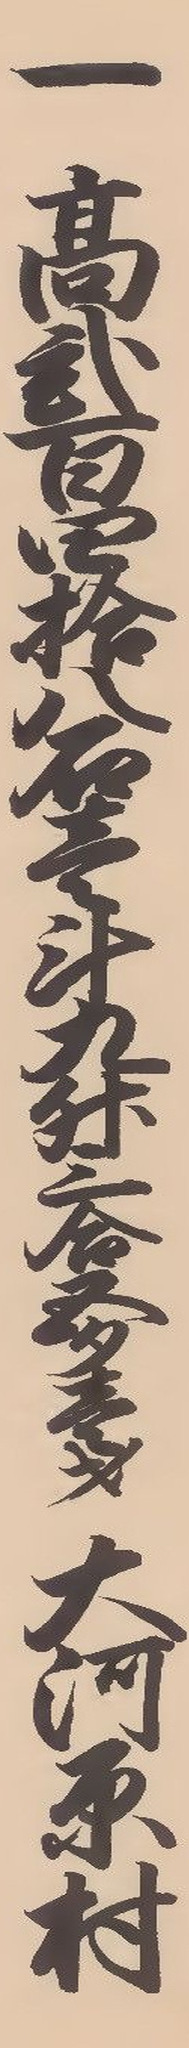一高弐百四拾八石壱斗九升三合五勺壱才大河原村
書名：伯耆国郷帳
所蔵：国立公文書館 National Archives of Japan
